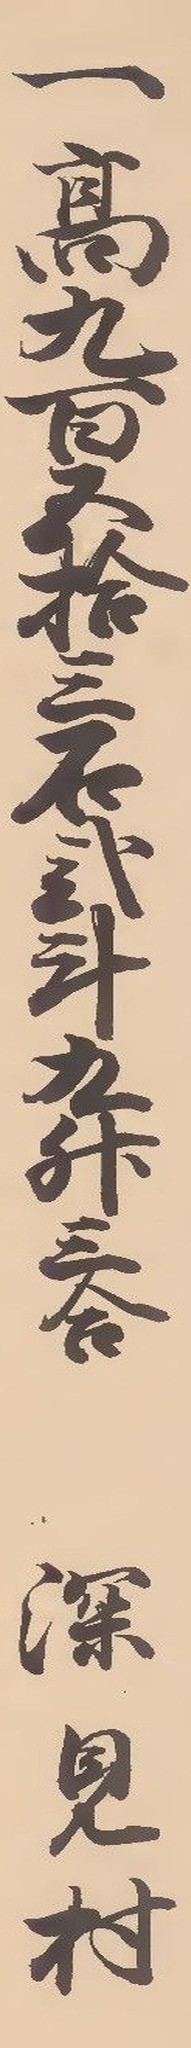一高九百五拾三石弐斗九升三合深見村
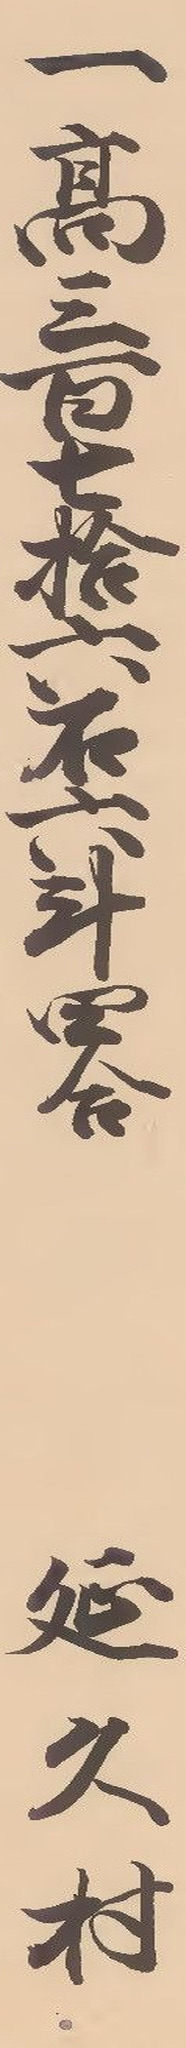一高三百七拾六石六斗四合延久村
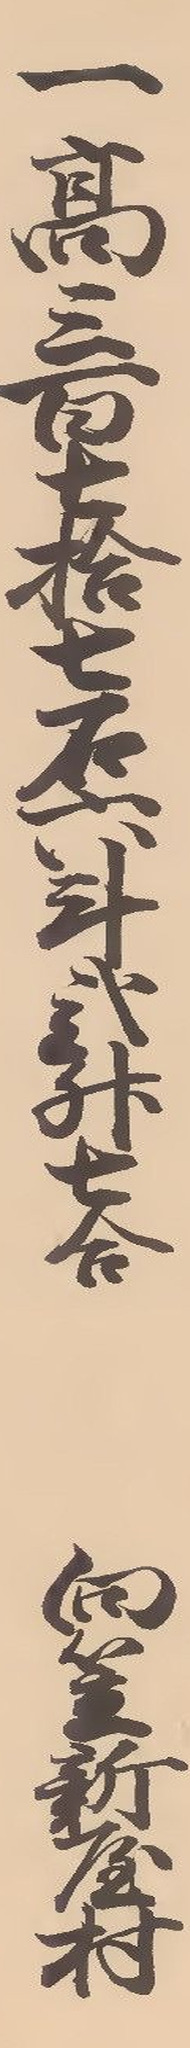一高三百七拾七石六斗弐升七合向笠新屋村
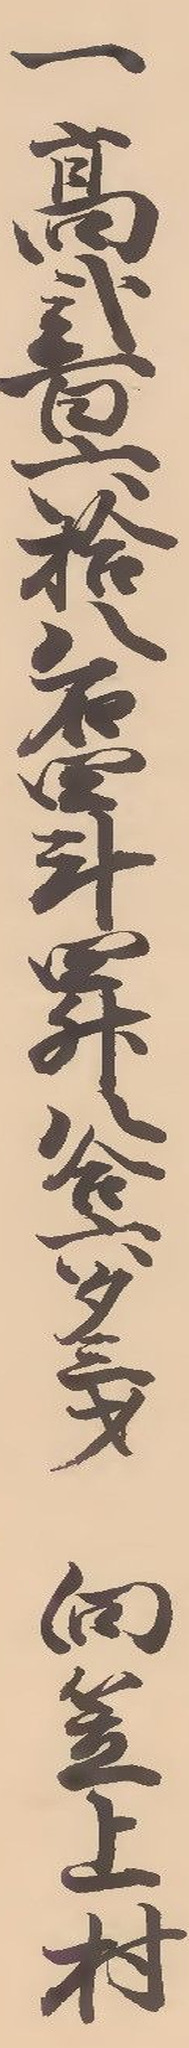一高弐百六拾八石四斗四升八合六勺三才向笠上村

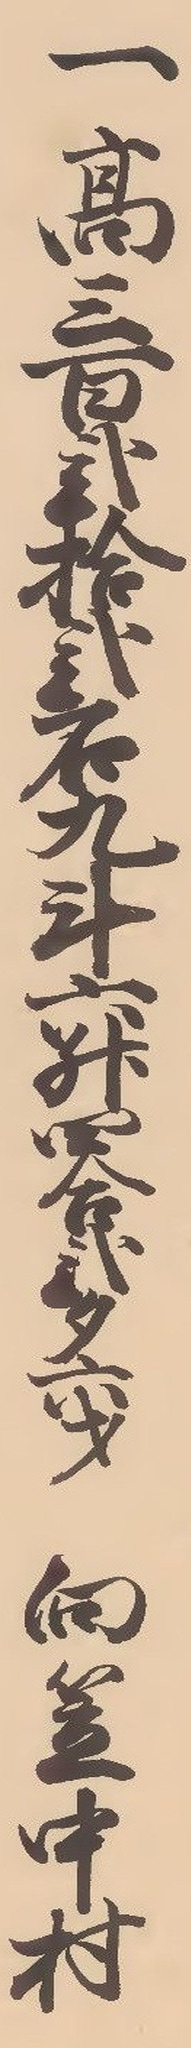一高三百弐拾弐石九斗六升四合弐勺六才向笠中村
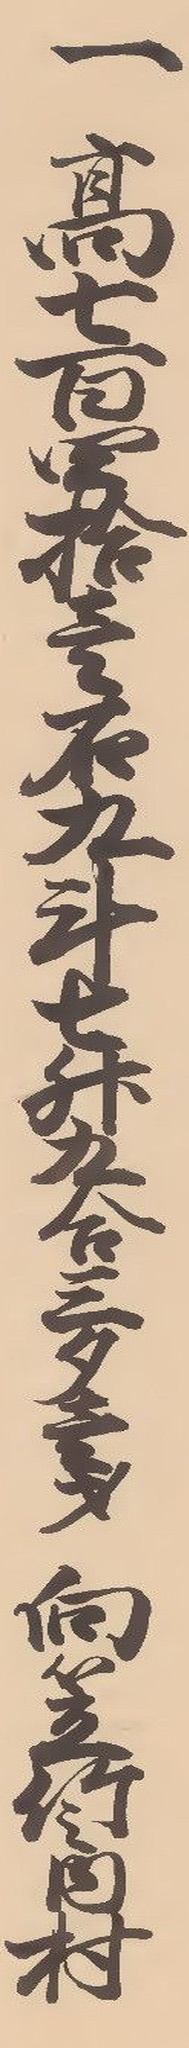一高七百四拾壱石九斗七升九合三勺壱才向笠竹之内村
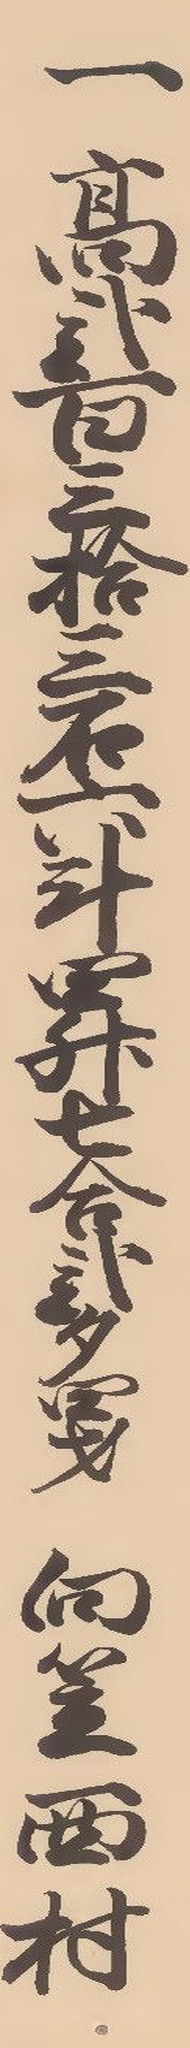一高弐百三拾三石六斗四升七合弐勺四才向笠西村
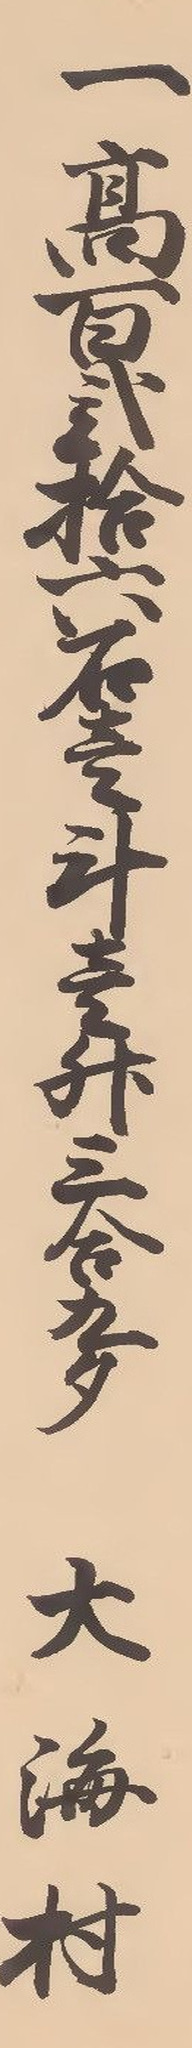一高百弐拾六石壱斗壱升三合九勺大海村
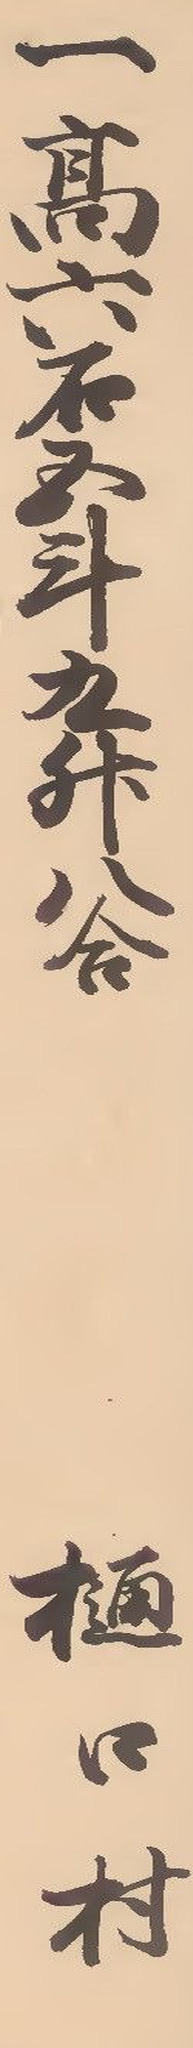一高六石五斗九升八合樋口村
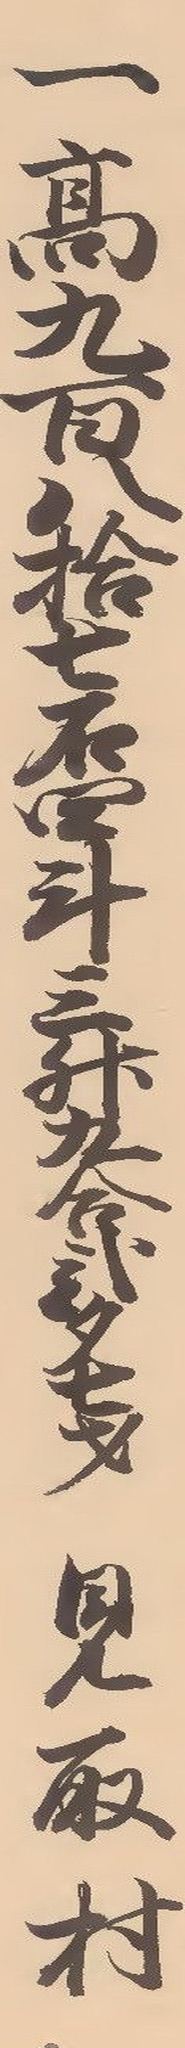一高九百八拾七石四斗三升九合弐タ七才見取村
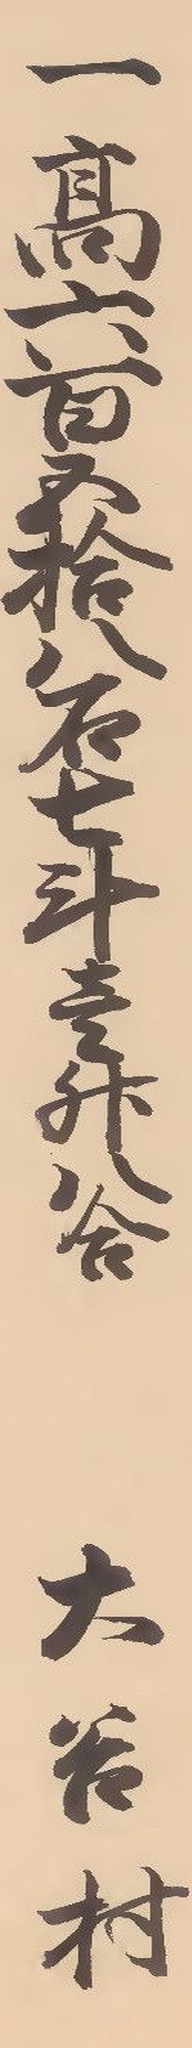一高六百五拾八石七斗壱升八合大谷村
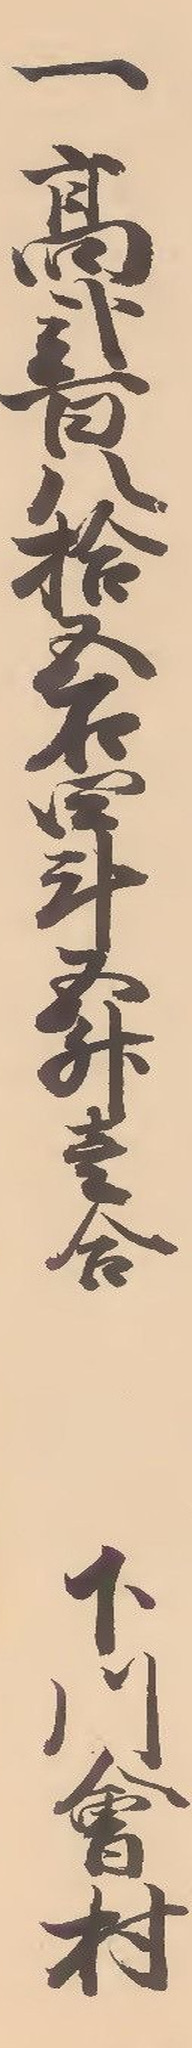一高弐百八拾五石四斗五升壱合下川会村

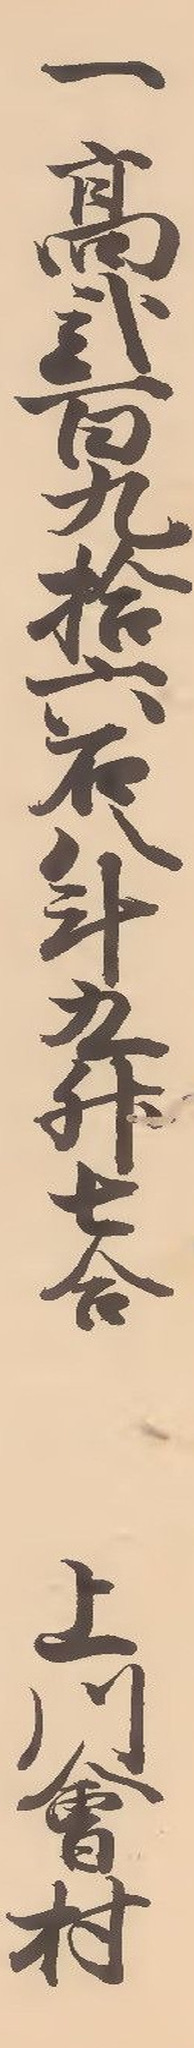一高弐百九拾六石八斗九升七合上川会村
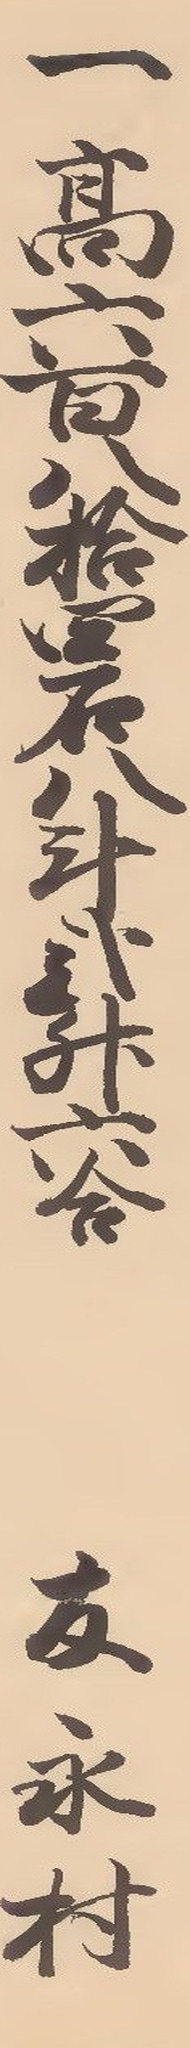一高六百八拾四石八斗弐升六合友永村
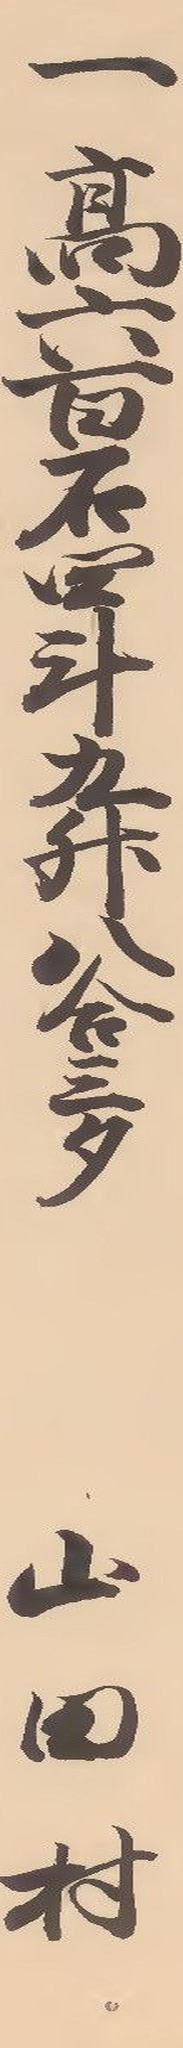一高六百石四斗九升八合三勺山田村
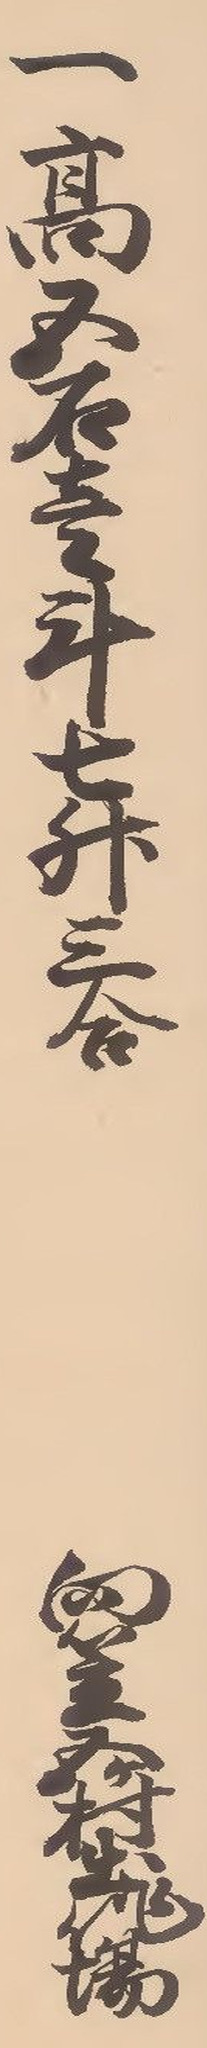一高五石壱斗七升三合向笠五ヶ村出作場
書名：遠江国郷帳
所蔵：国立公文書館 National Archives of Japan
